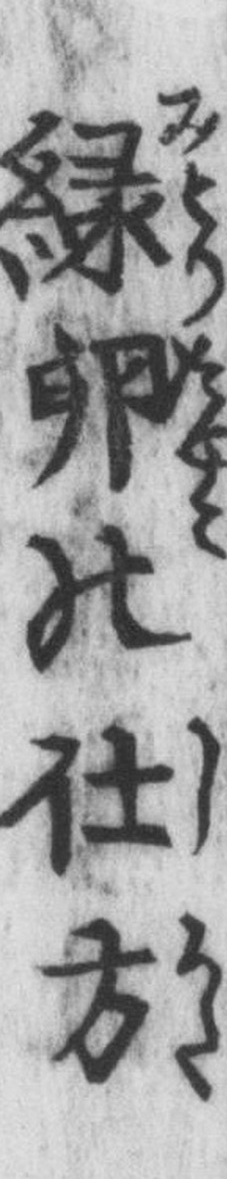緑卵の仕方
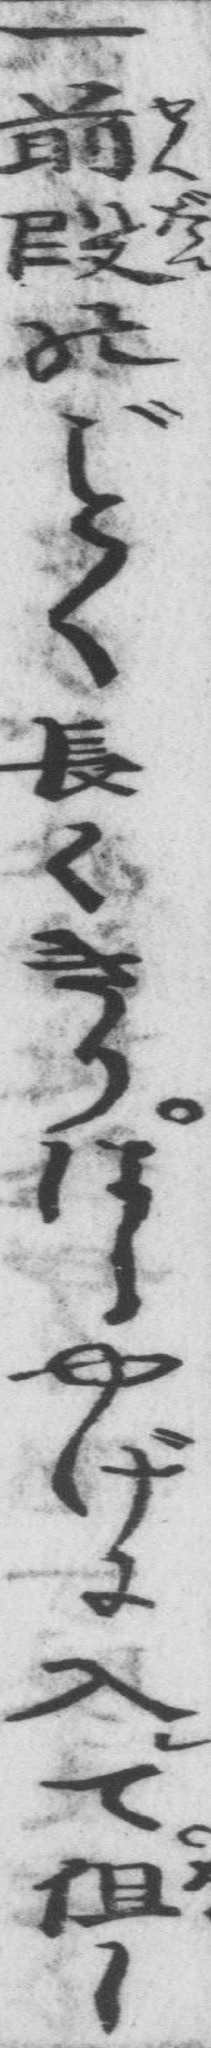一前段のごとく長くきり。はしやげに入れて。但し
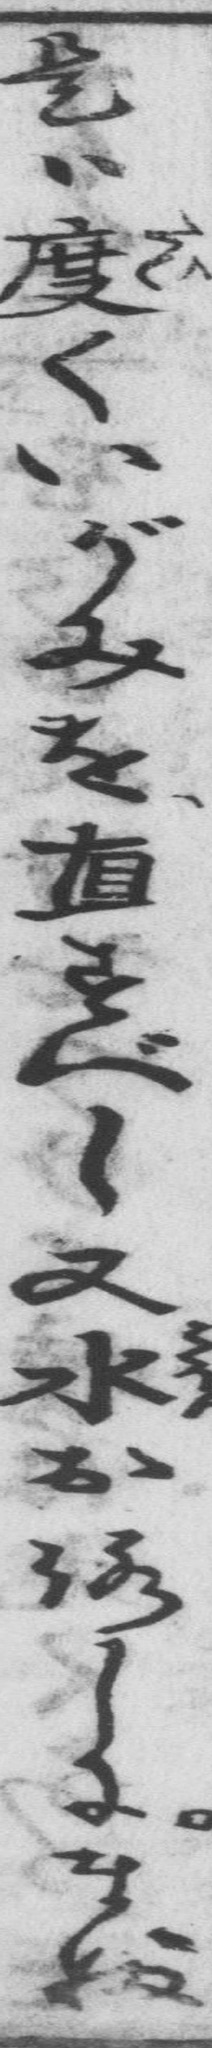是は度〳〵いがみを直すべし又氷おろしに。まぶ
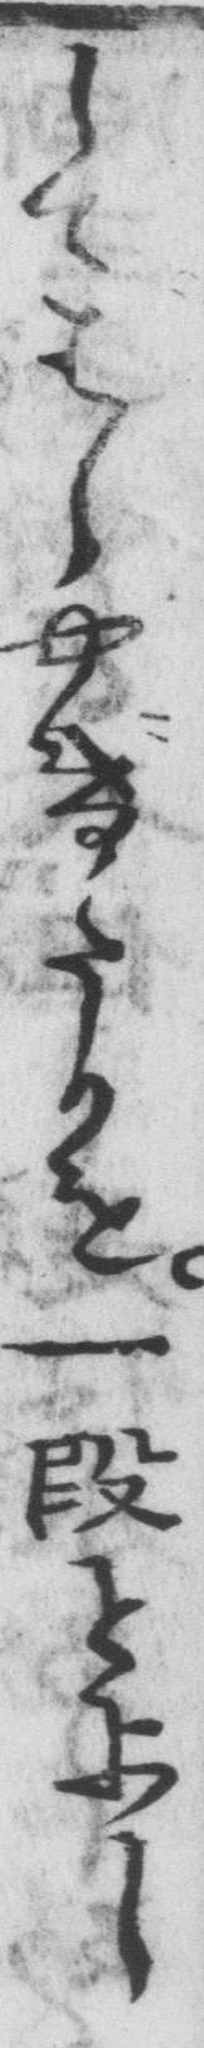してはしやげたりも。一段とよし
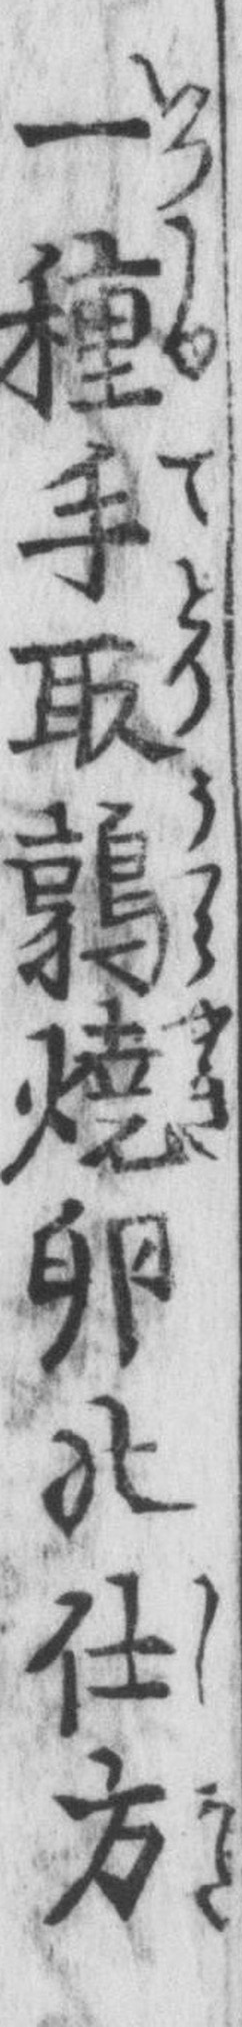一種手取鶉焼卵の仕方
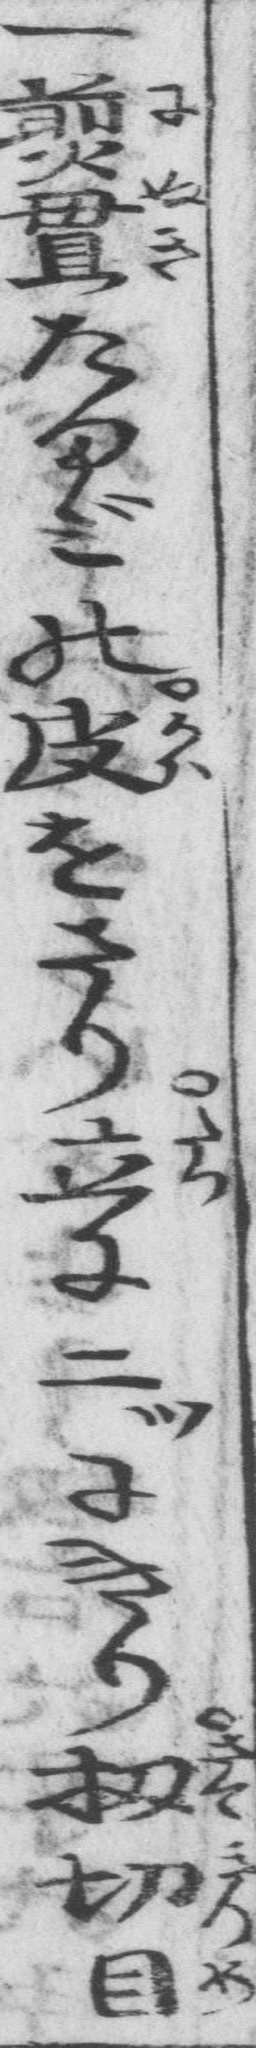一煎貫たまごの。皮をさり。立に二ツにきり。扨切目
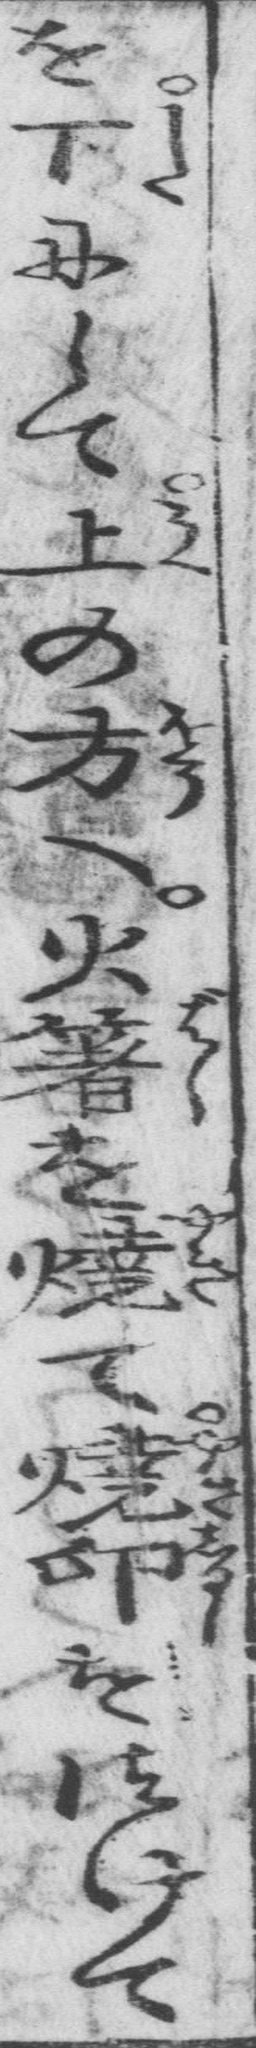を。下にして。上の方へ。火箸を焼て。焼印をつけて
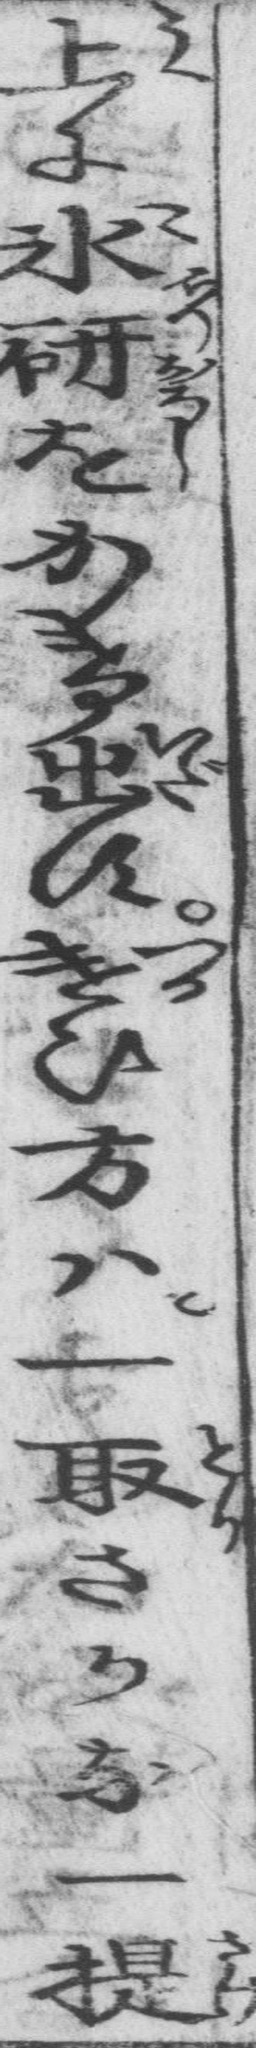上に氷研をかけ出す。遣ひ方は。一取さかな一提
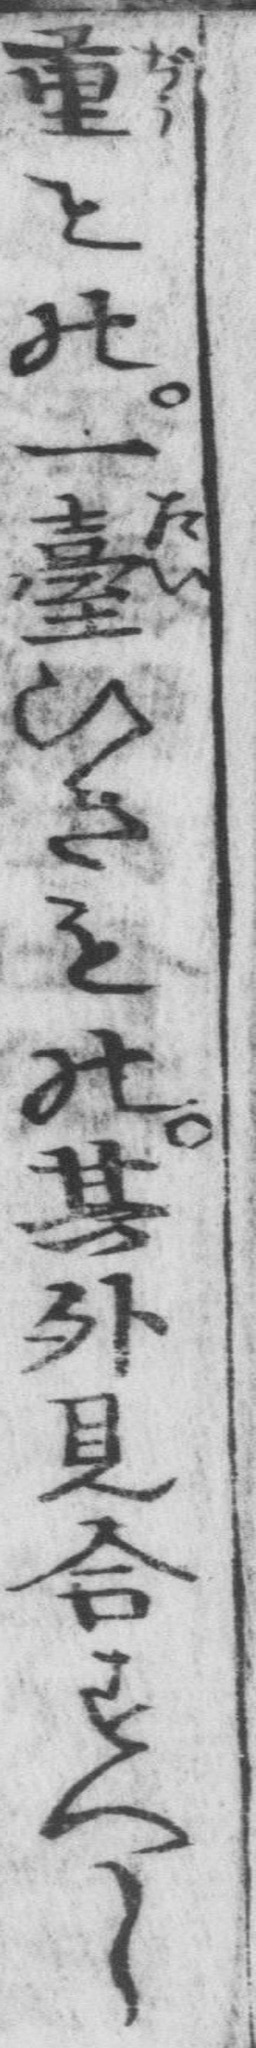重もの。一台ひきもの。其外見合すへし
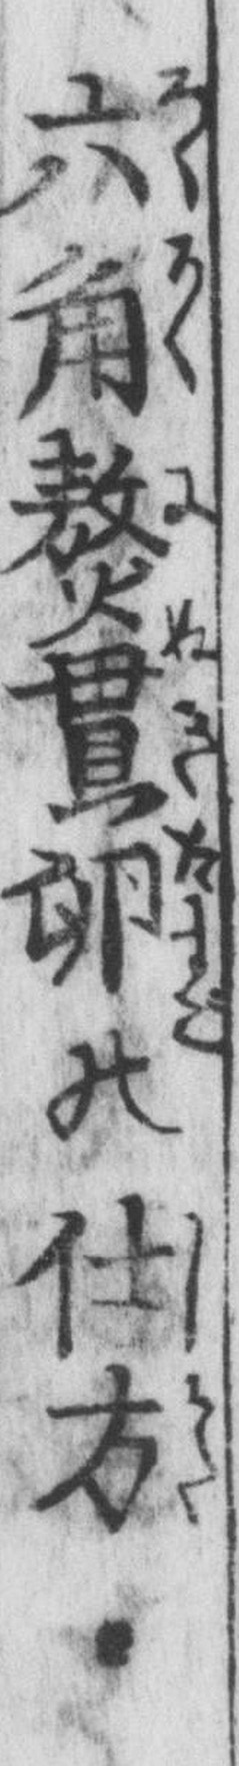六角熬貫卵の仕方
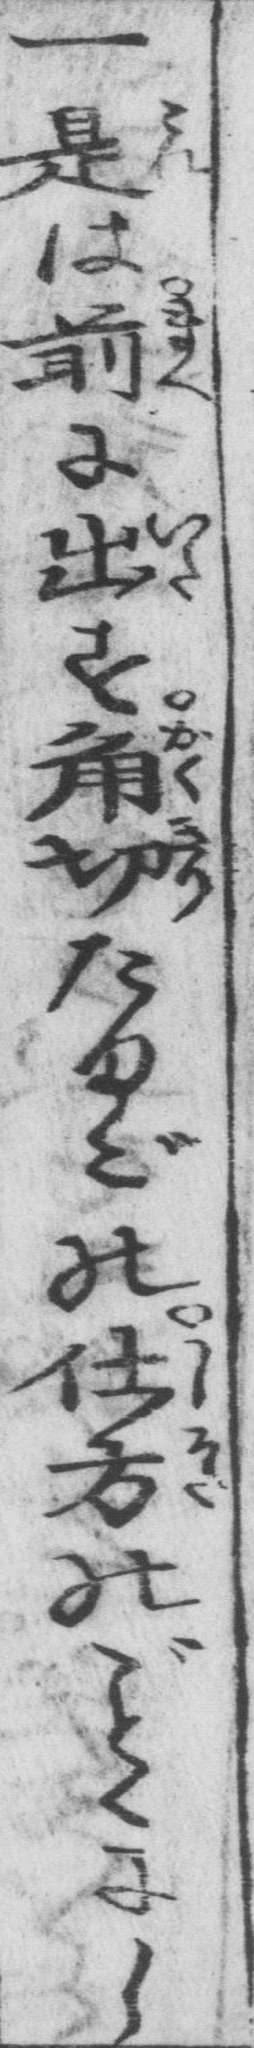一是は。前に出す。角切たまごの。仕方のごとくにし
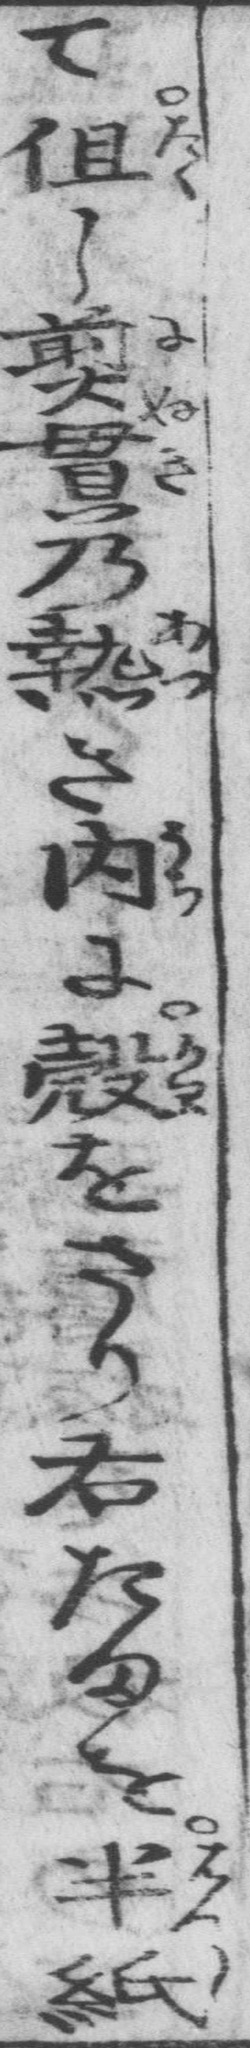て。但し煎貫の熱き内に。殻をさり右たまを。半紙

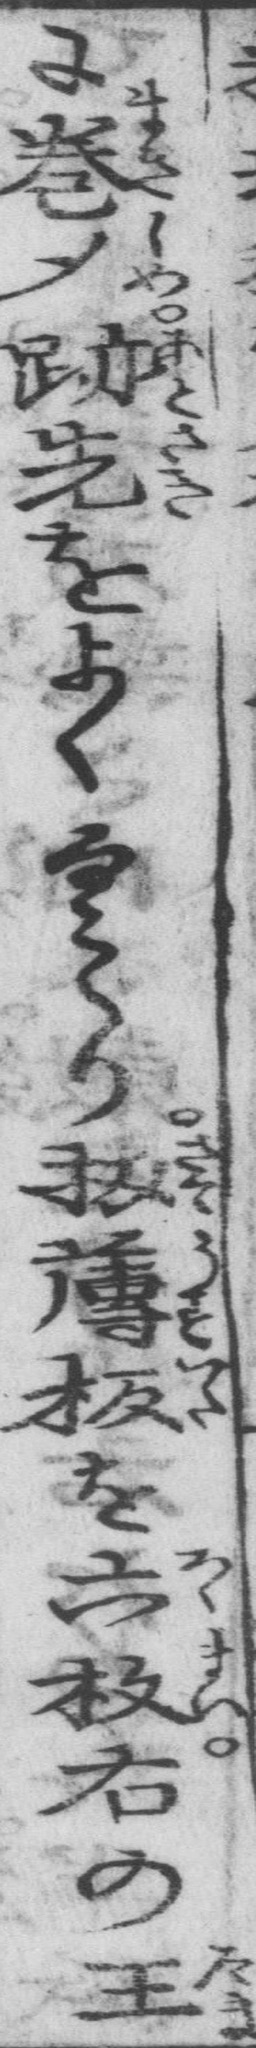に巻〆。跡先をよくくゝり。扨薄板を六枚。右の玉
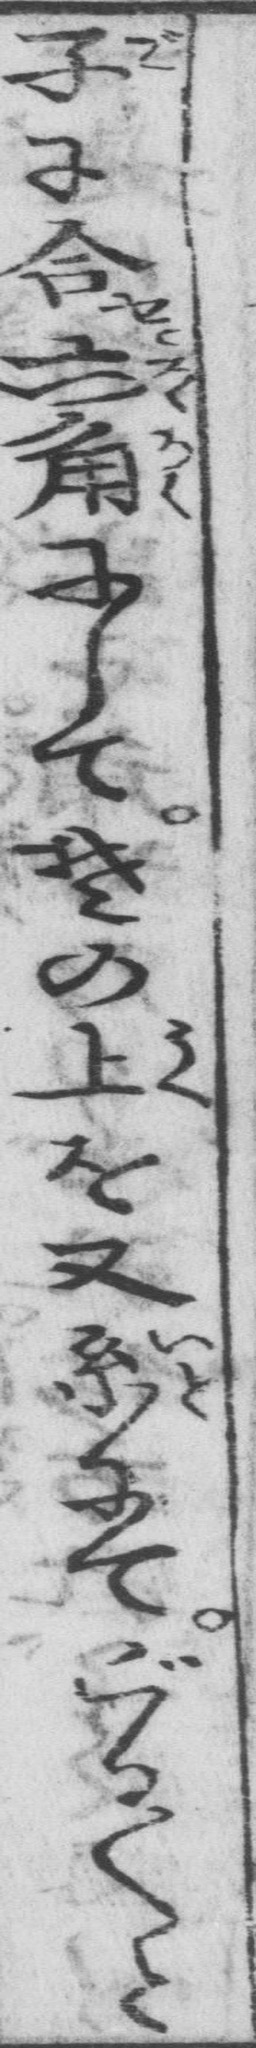子に合せ。六角にして。その上を又糸にて。ぐる〳〵と
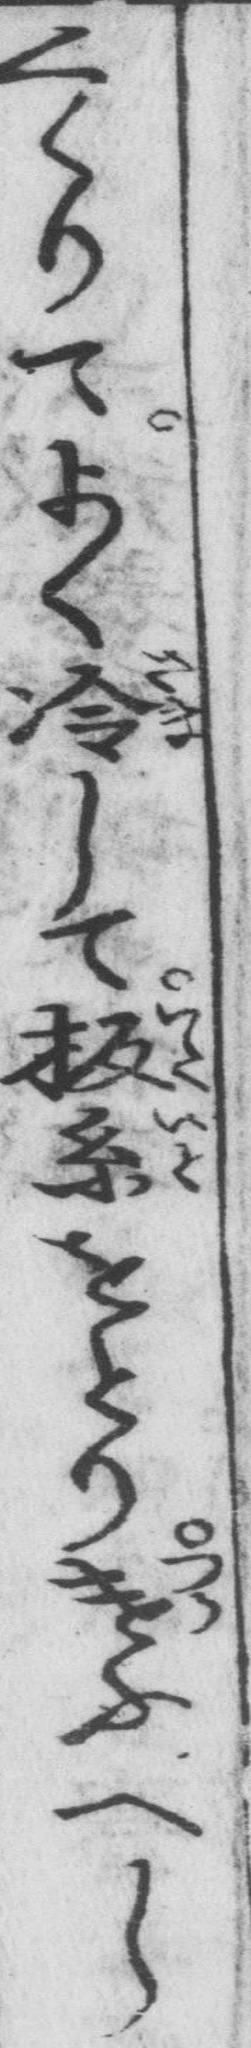くゝりて。よく冷して。板糸をとり。遣ふへし
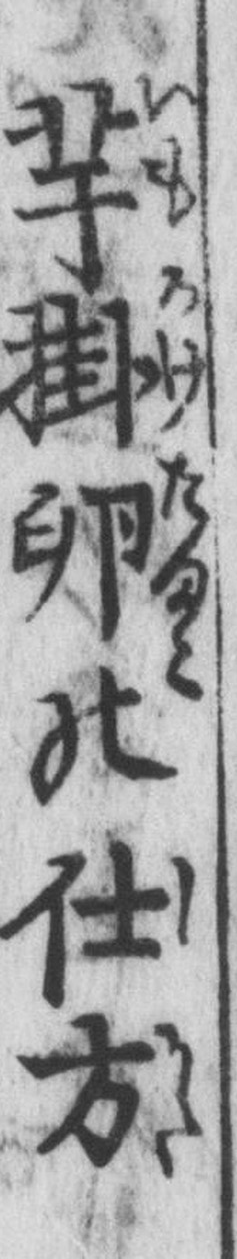芋掛卵の仕方
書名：萬寳料理秘密箱
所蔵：大阪府立大学学術情報センター 国文学研究資料館
